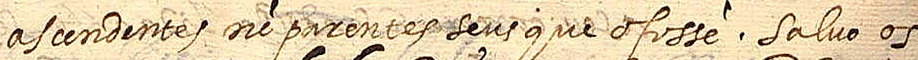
ascendentes nē parentes seu que o fossē. saluo os
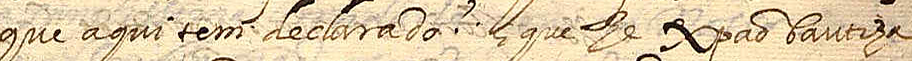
que aqui tem declarado⹎ E que he xpaõ bautiza
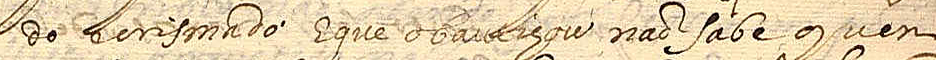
do e crismado. E que o bautizou naõ sabe quem
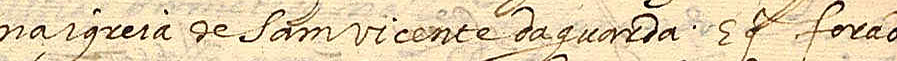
na igreia de sam vicente da guarda. E q̄ foraõ
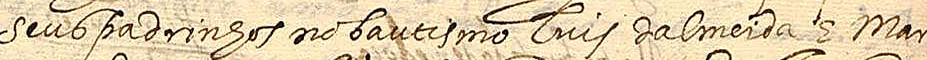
seus padrinhos no bautismo luis dalmeida E Mar
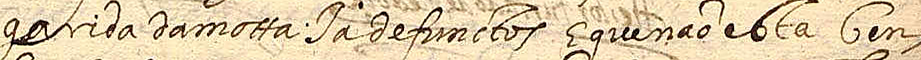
garida da motta. Ia defunctos E que naõ esta bem
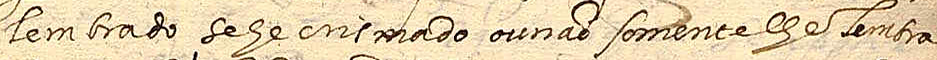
lembrado se he crismado ou naõ somente lhe lembra
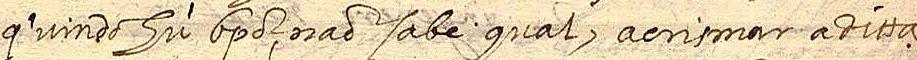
q̄ uindo hū bpō, naõ sabe qual, a crismar a ditta
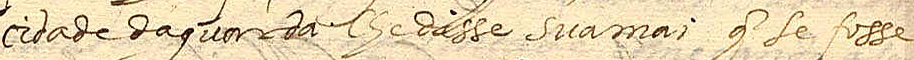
cidade da guarda lhe disse sua mai q̄ se fosse
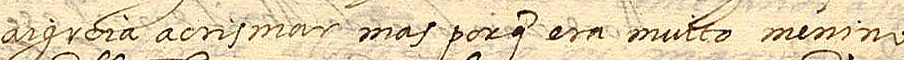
a igreia a crismar mas porq̄ era muito menino
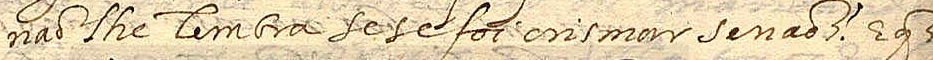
naõ lhe lembra se se foi crismar se naõ⹎ E q̄
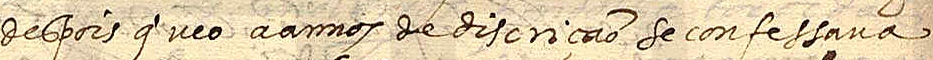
despois q̄ ueo a annos de discriçaõ se confessaua
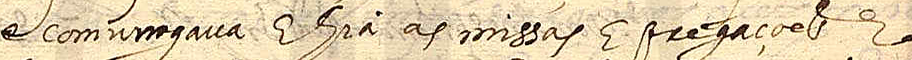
e comumgaua E hia as missas E pregaçoẽs E
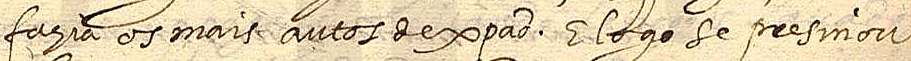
fazia os mais autos de xpaõ. E logo se presinou
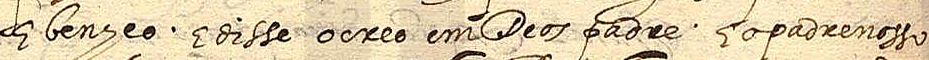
E benzeo. E disse o creo em Deos padre. E o padre nosso
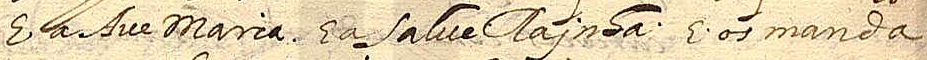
E a Aue Maria, E a Salue Rajnha E os manda
